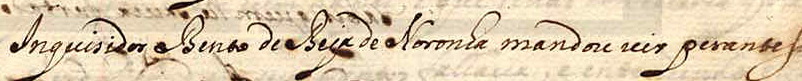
Inquisidor Bento de Beja de Noronha mandou uir perante si
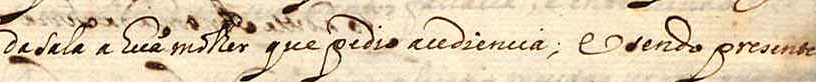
da sala a huā mulher que pedio audiencia; e sendo presente
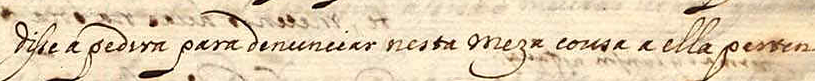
disse a pedira para denunciar nesta meza cousa a ella perten
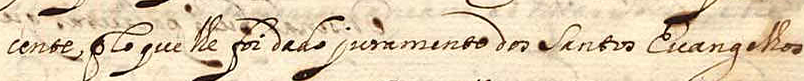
cente, plo que lhe foi dado juramento dos Santos Euangelhos
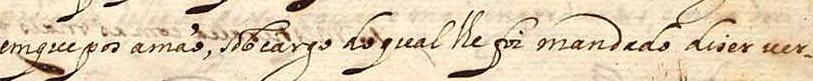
em que pos a maõ, sob cargo do qual lhe foi mandado diser uer
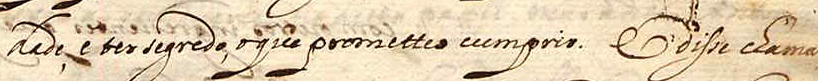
dade, e ter segredo, o que prometteo cumprir. E disse chamar
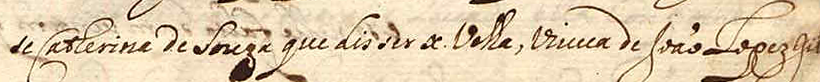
se Catherina de Souza que diz ser x. Velha, viuua de João Lopez Gil
